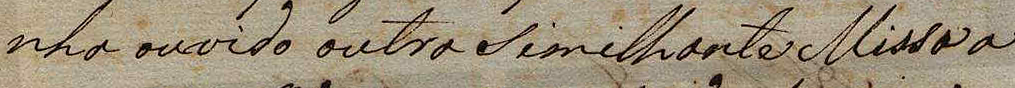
nha ouvido outra similhante Missa a
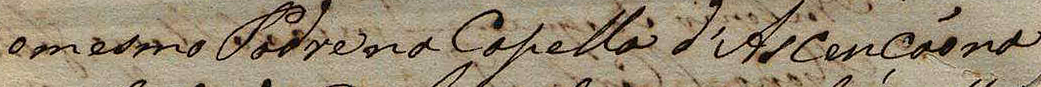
o mesmo Padre na Capella d’Ascençaõ na
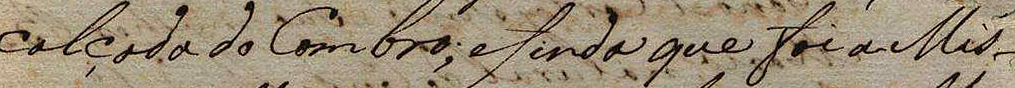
calçada do Combro; e finda que foi a Mis
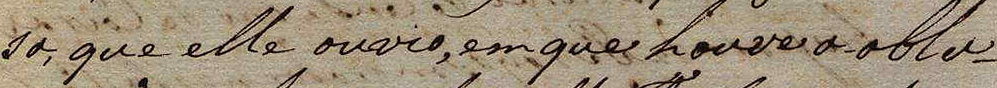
sa, que elle ouvio, em que houve a ablu
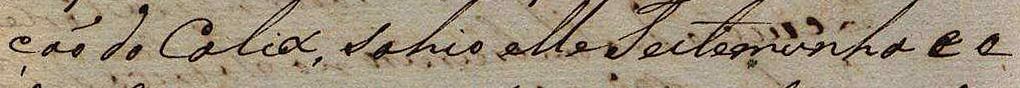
çaõ do Calix, sahio elle Testemunha e o
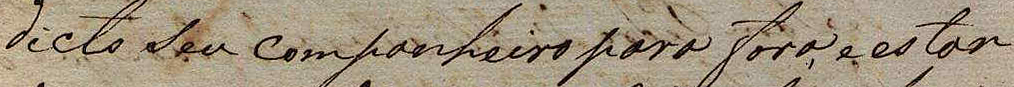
dicto seu companheiro para fora, e estan
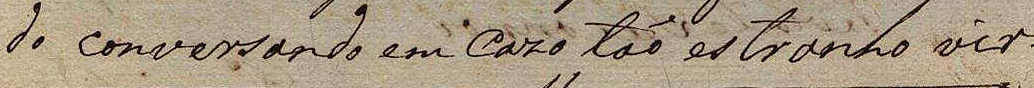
do conversando em cazo taõ estranho vir
